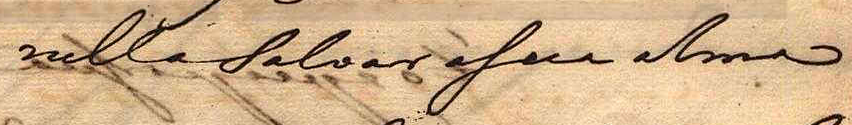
nella salvar a sua alma
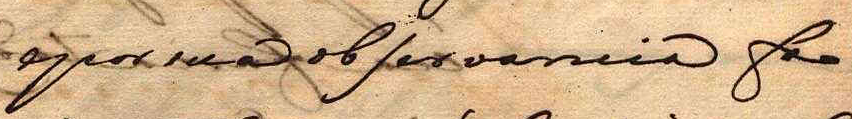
e por sua observancia fa
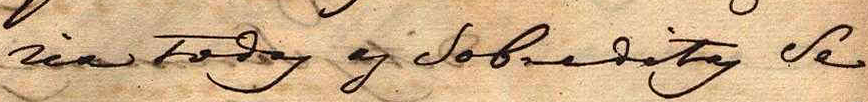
zia todas as Sobreditas Se
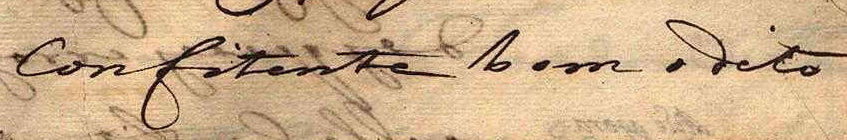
confitente bom o dito
